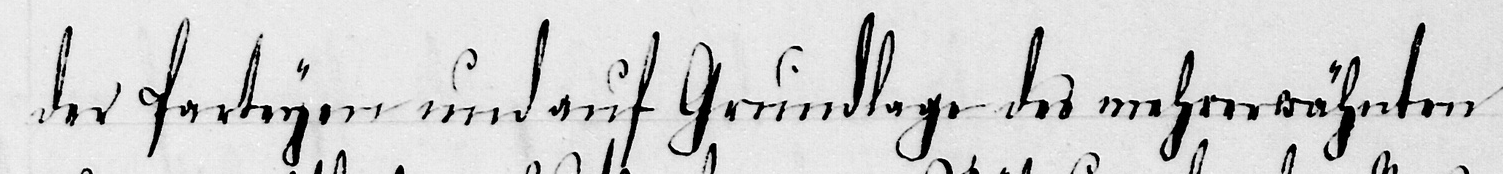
der Parteyen und auf Grundlage des mehrerwähnten
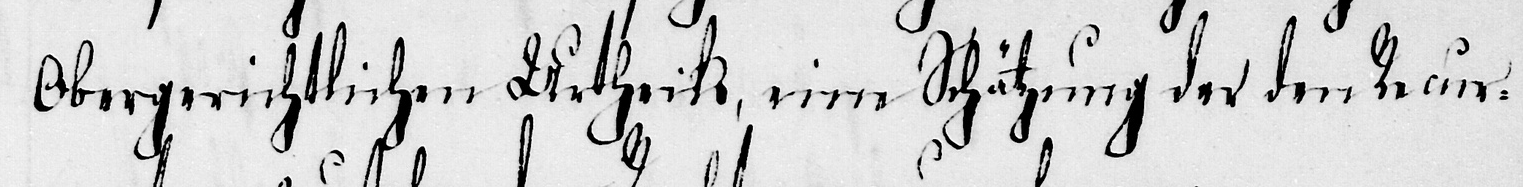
Obergerichtlichen Urtheils, eine Schätzung der den Recur¬
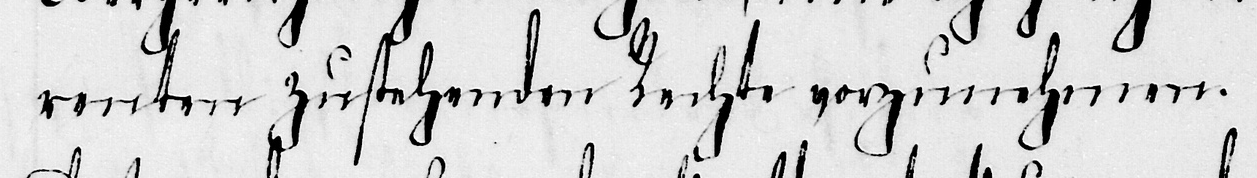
renten zustehenden Rechte vorzunehmen.
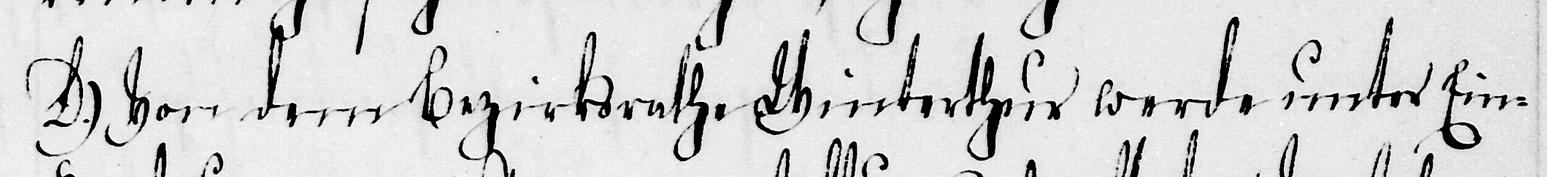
D.) Von dem Bezirksrathe Winterthur werde unter Ein¬
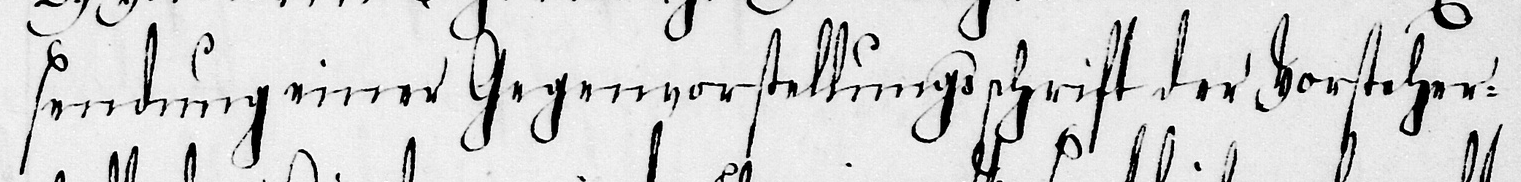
sendung einer Gegenvorstellungsschrift der Vorsteher¬
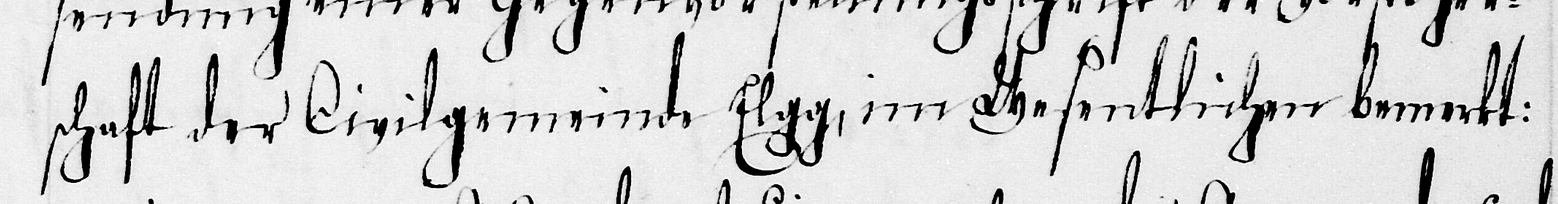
schaft der Civilgemeinde Elgg, im Wesentlichen bemerkt:
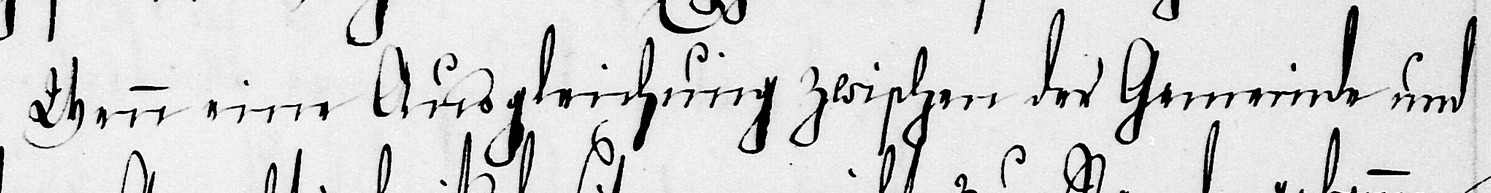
Wenn eine Ausgleichung zwischen der Gemeinde und
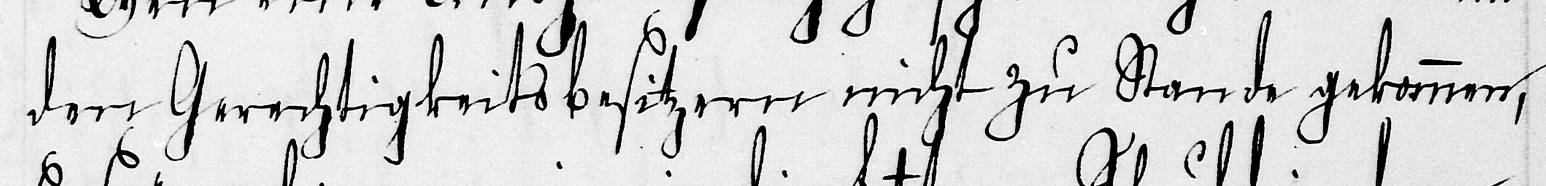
den Gerechtigkeitsbesitzern nicht zu Stande gekommen,
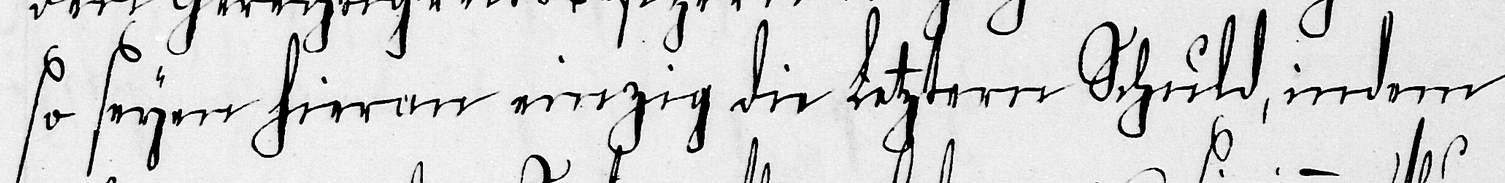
so seyen hieran einzig die Letztern Schuld, indem
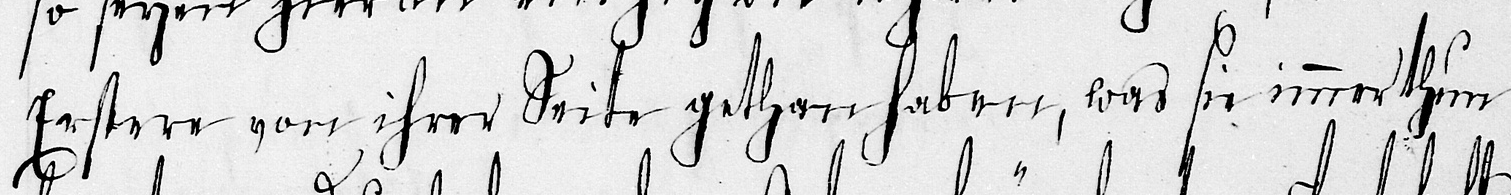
Erstere von ihrer Seite gethan haben, was sie immer thun
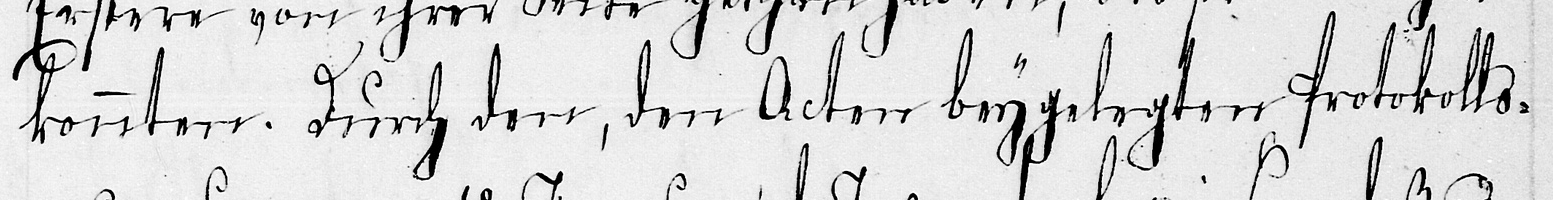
konnten. Durch den, den Acten beygelegten Protokoll¬
